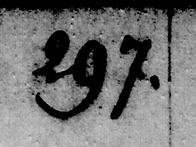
88.
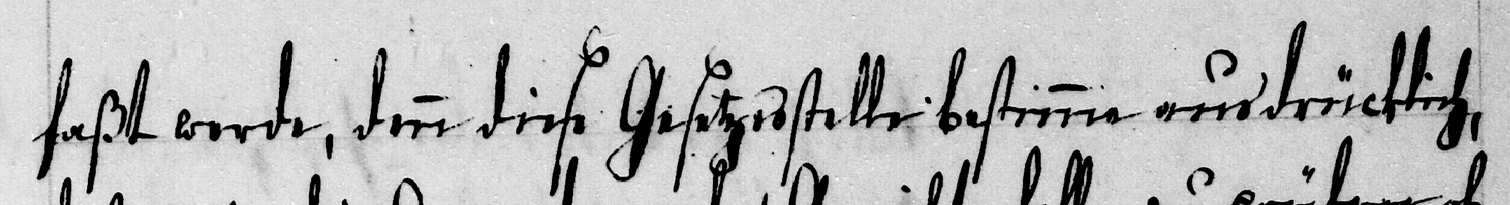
faßt werde, denn diese Gesetzesstelle bestimme ausdrück¬
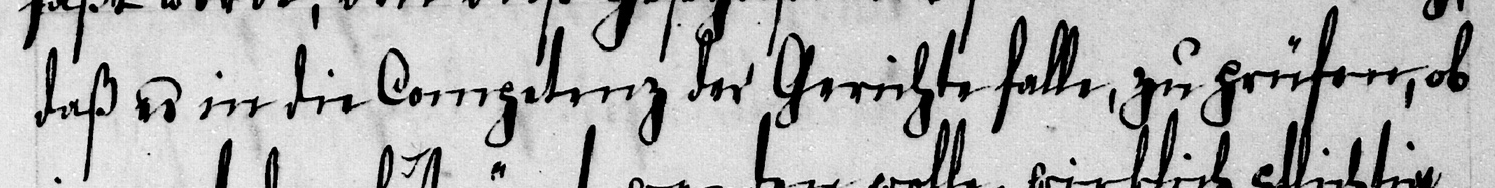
daß es in die Competenz der Gerichte falle, zu prüfen, ob
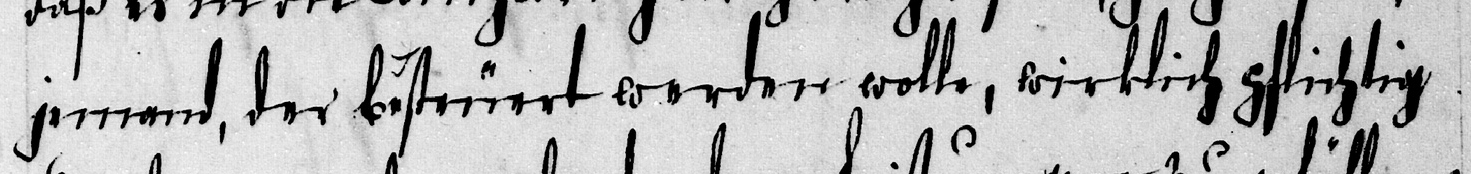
jemand, der besteuert werden wolle, wirklich pflichtig
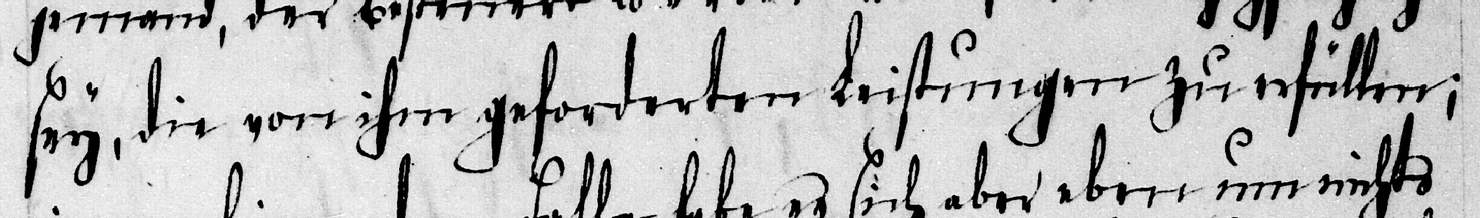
sey, die von ihm geforderten Leistungen zu erfüllen;
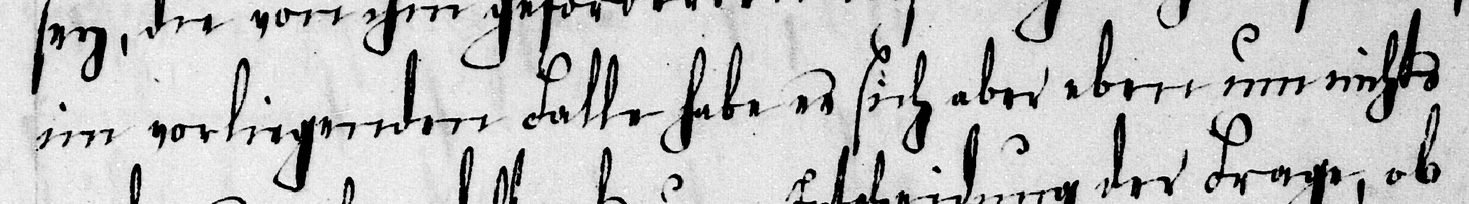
im vorliegenden Falle habe es sich aber eben um nichts
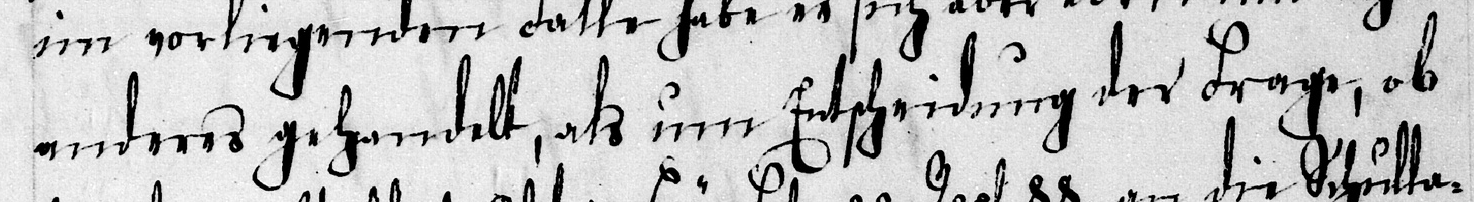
anderes gehandelt, als um Entscheidung der Frage, ob
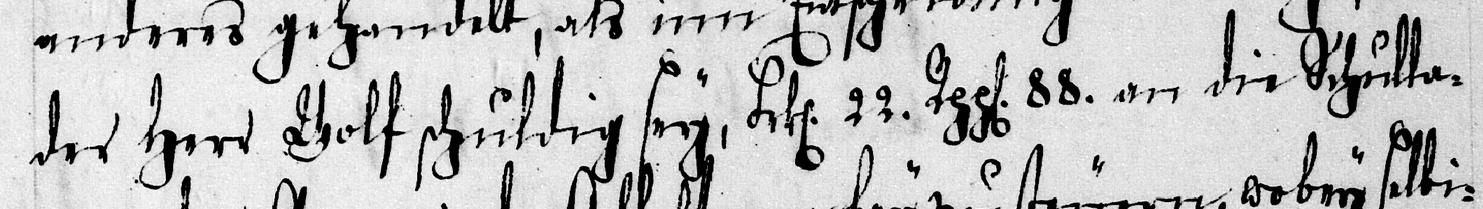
der Herr Wolf schuldig sey, Frk[en]. 22. Rpp[e¬
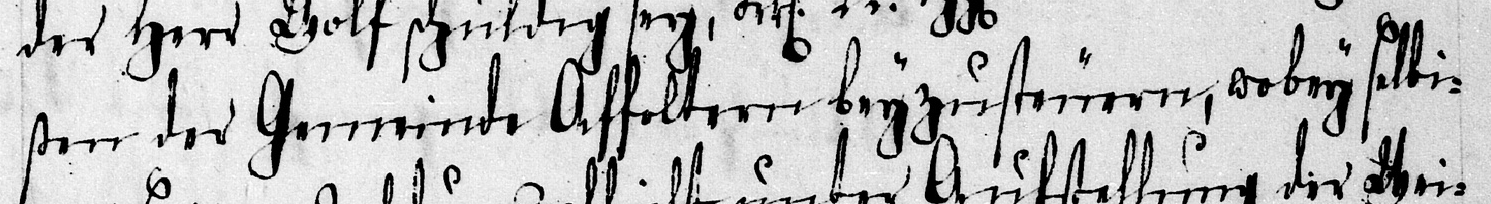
sten der Gemeinde Affoltern beyzusteuern, wobey selbi¬
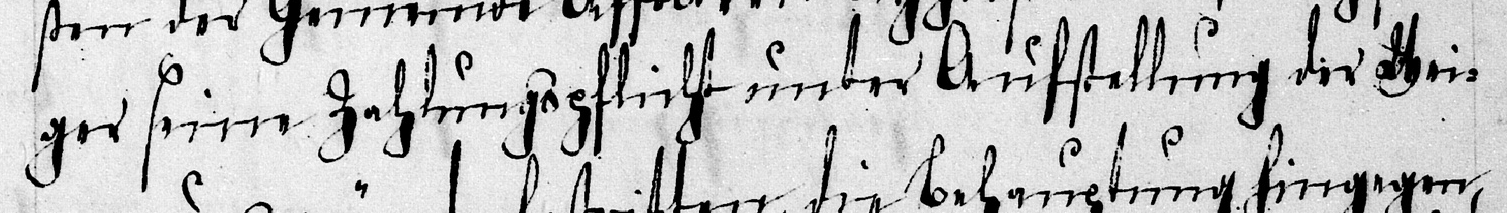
ger seine Zahlungspflicht unter Aufstellung der Wei¬
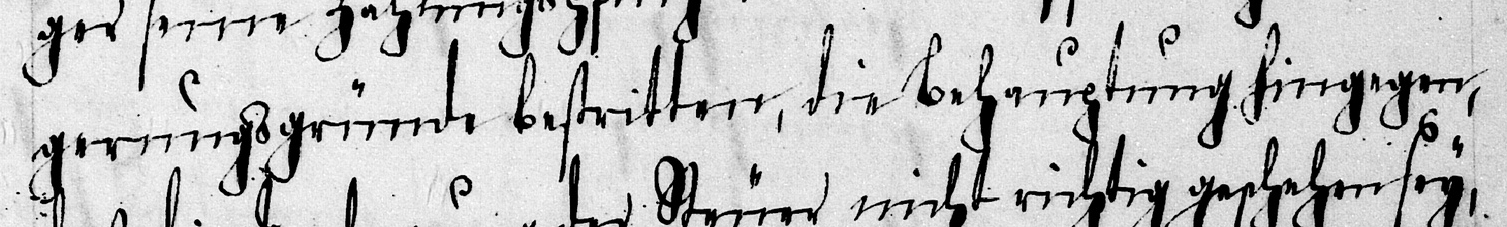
gerungsgründe bestritten, die Behauptung hingegen,
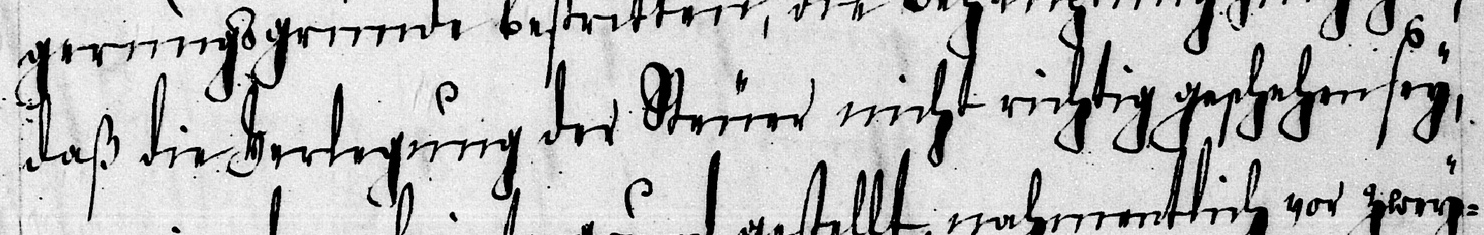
daß die Verlegung der Steuer nicht richtig geschehen sey,
